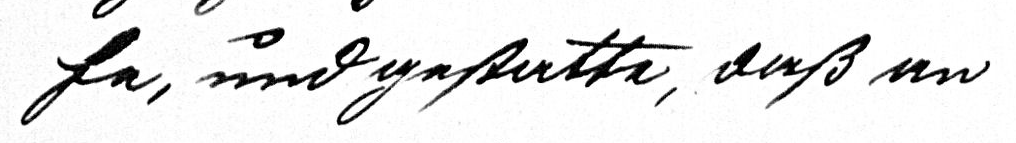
fe, und gestatte, daß an
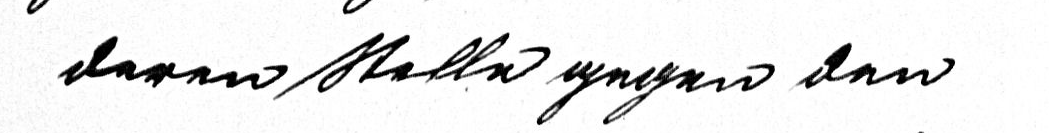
deren stelle gegen den
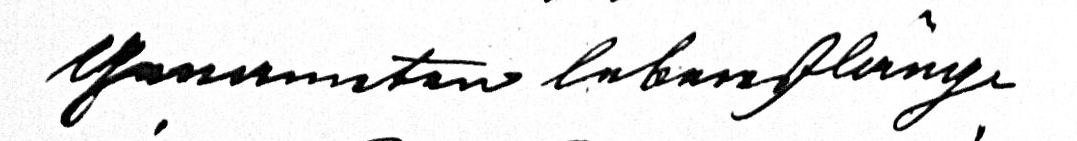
Genannten lebensläng¬
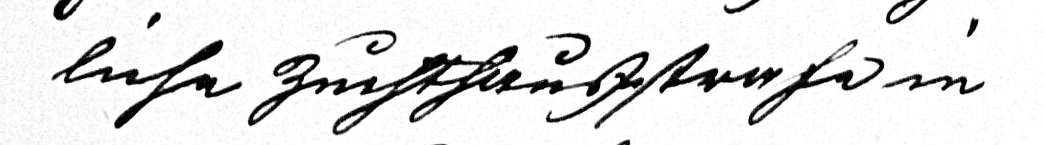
liche Zuchthausstrafe in
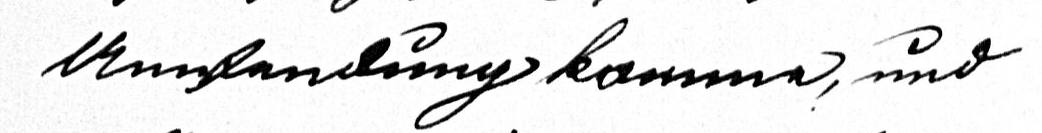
Anwendung komme, und
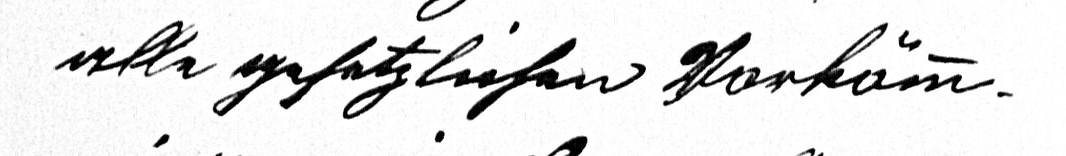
alle gesetzlichen Vorkömm¬
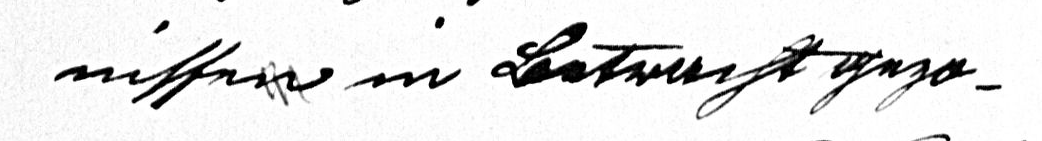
nisse in Betracht gezo¬
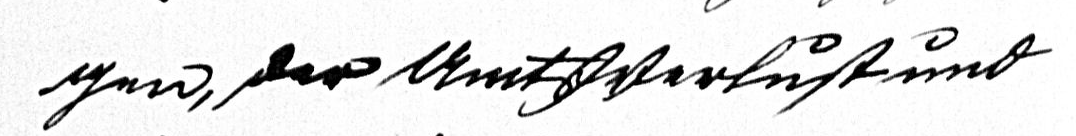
gen, der Amtsverlust und
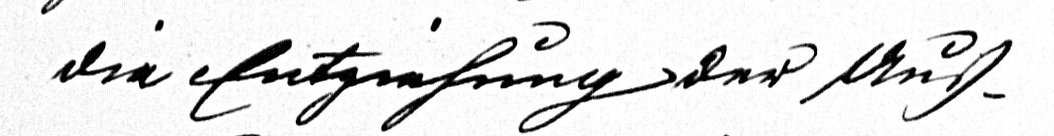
die Entziehung der Aus¬
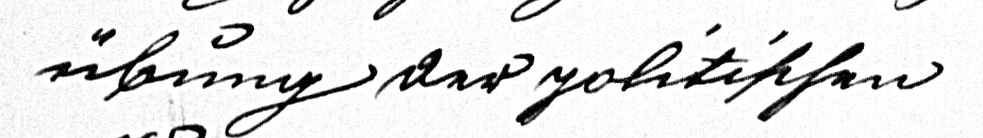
übung der politischen
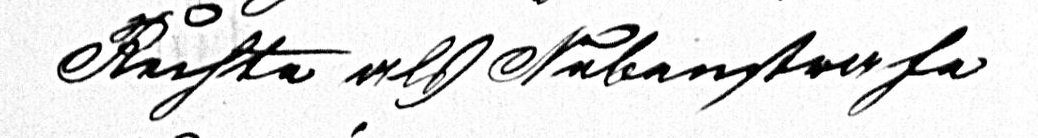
Rechte als Nebenstrafe
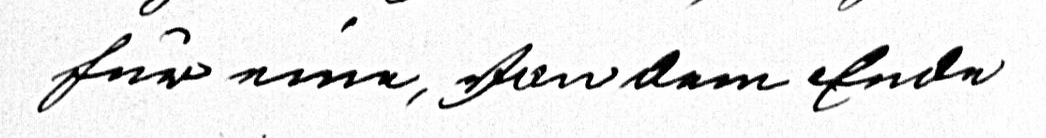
für eine, von dem Ende
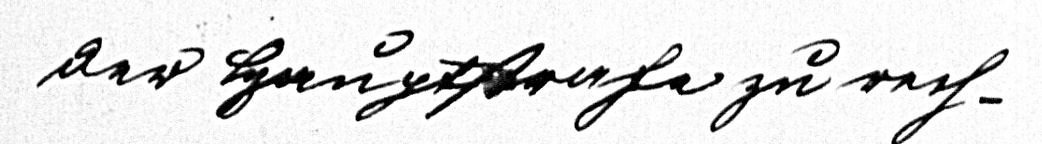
der Hauptstrafe zu rech¬
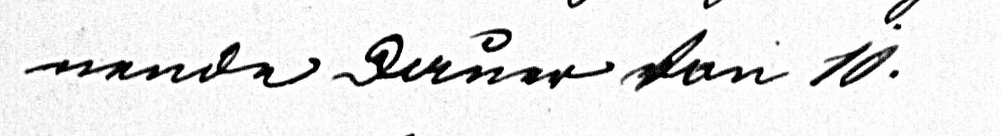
nende Dauer von 10.
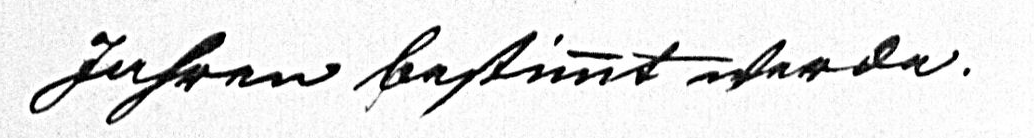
Jahren bestimmt werde.
